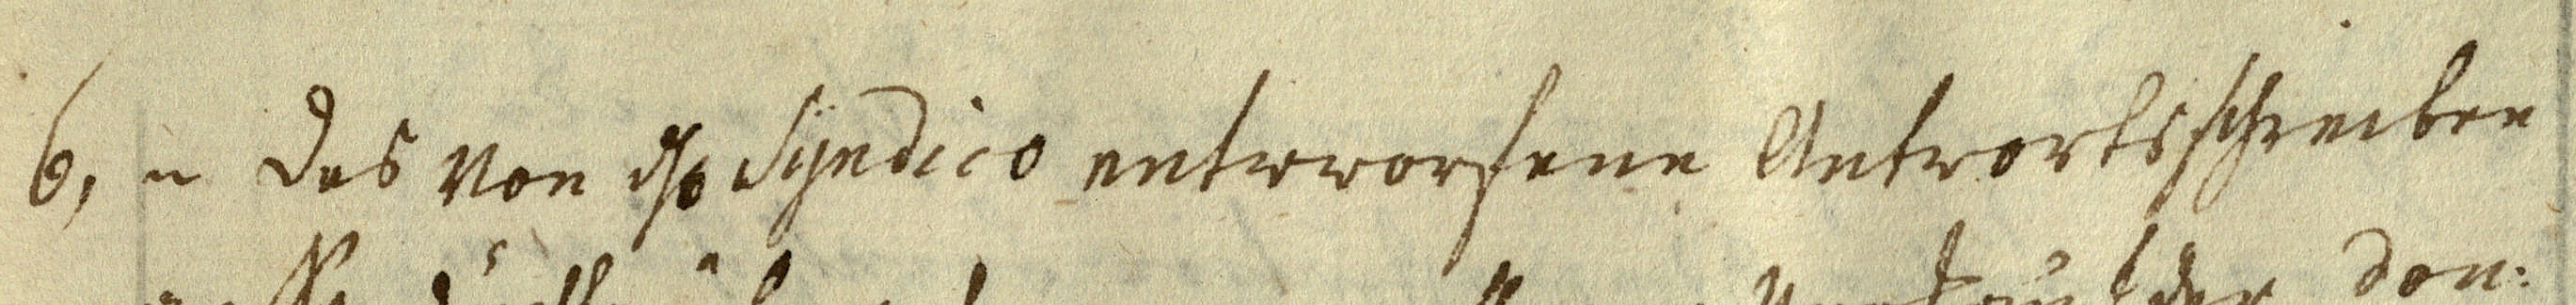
6. Das von dh Sÿndico entworfene Antwortsschreiben
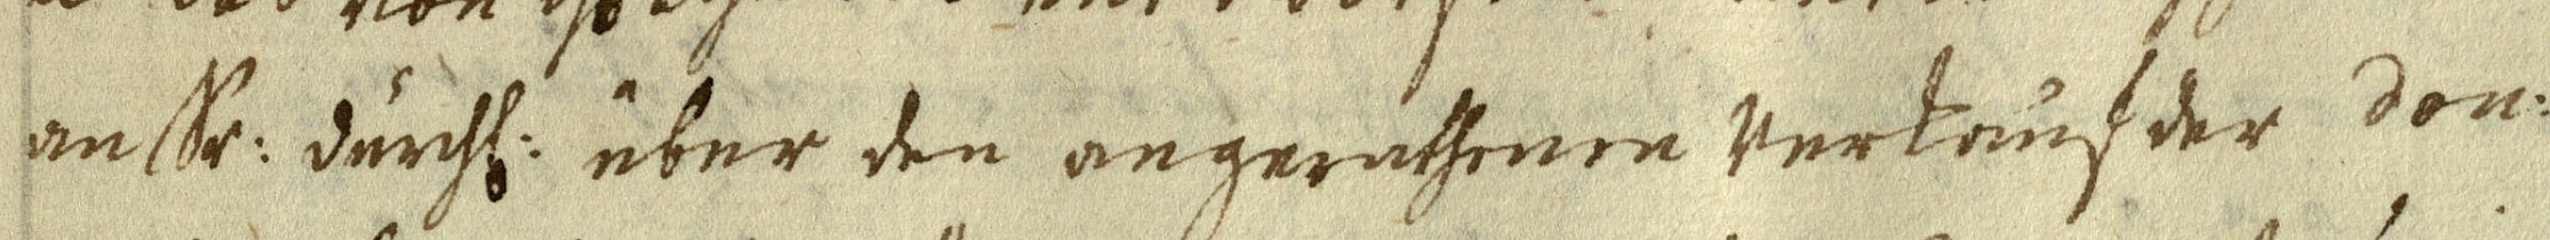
an Sr. Durchl. über den angerathenen Verkauf der dou¬
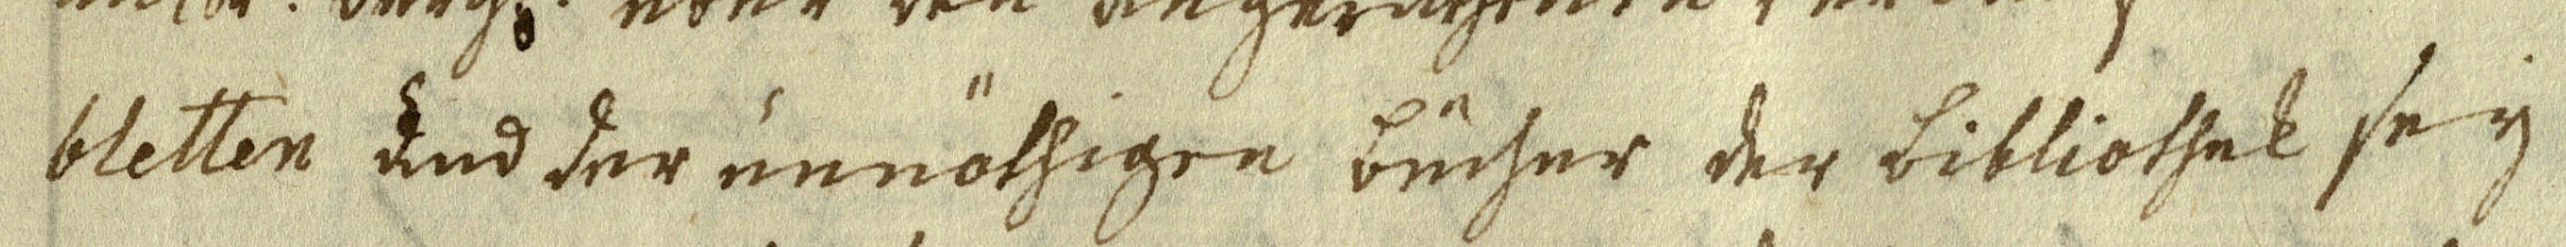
bletten und der unnöthigen Bücher der Bibliothek seÿ
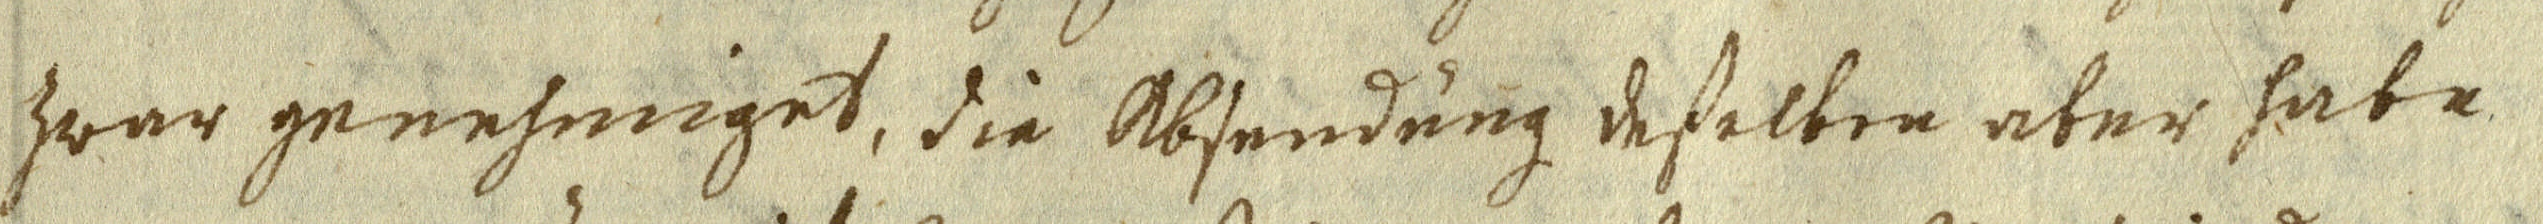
zwar genehmiget, die Absendung deßelben aber habe
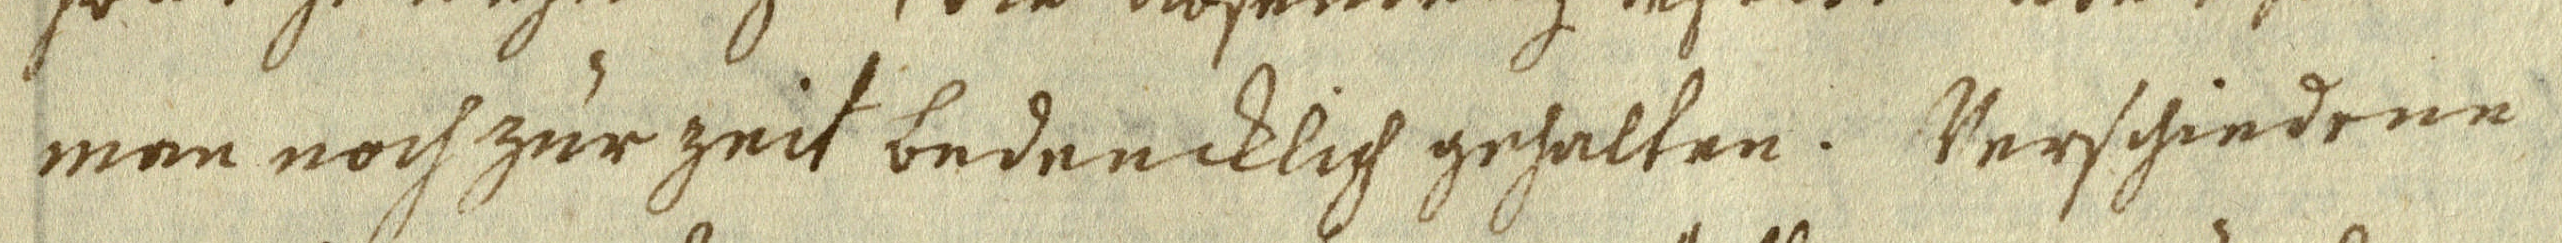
man noch zur zeit bedencklich gehalten. Verschiedene
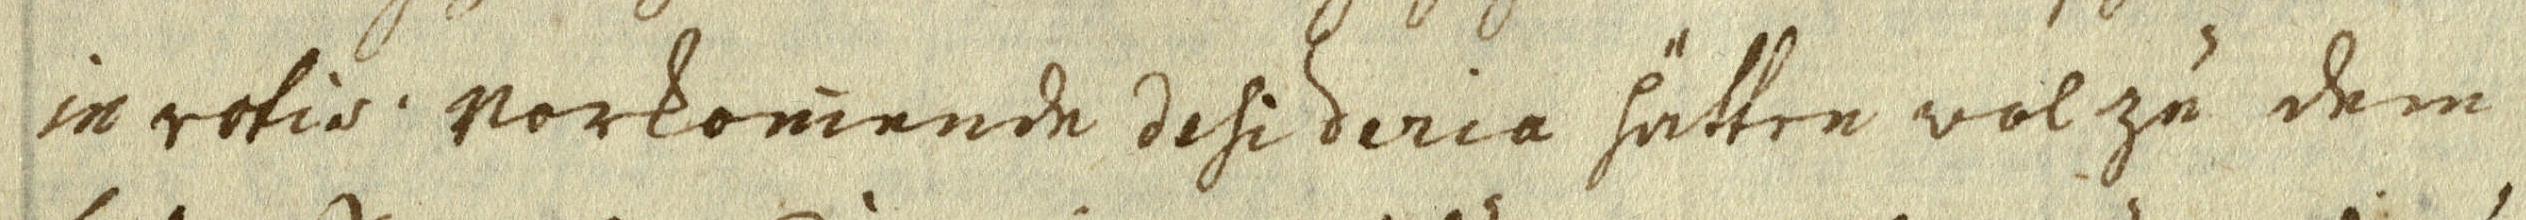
in votis vorkomende desideria hätten wol zu dem
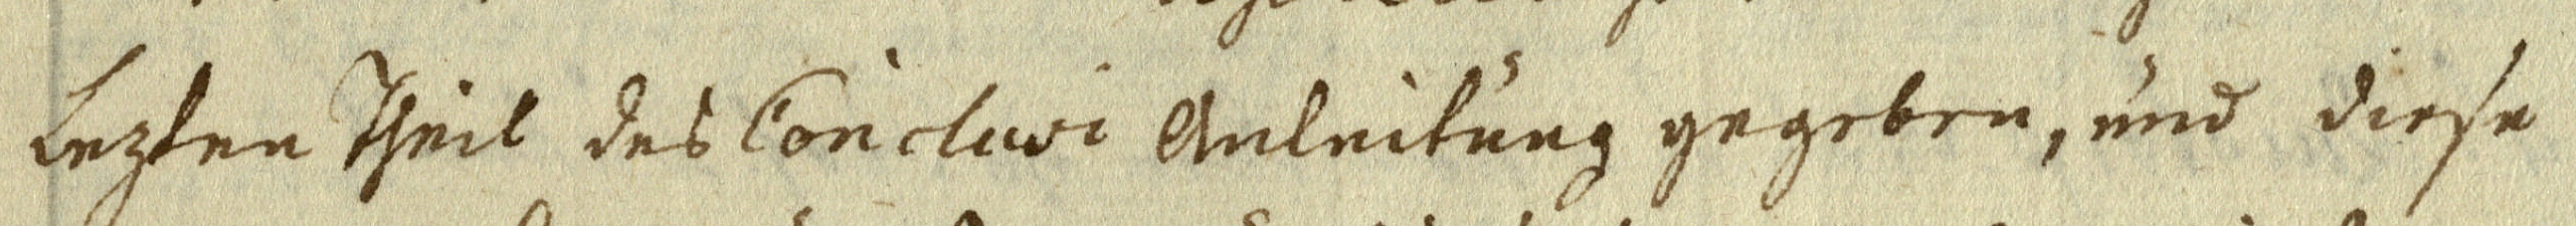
lezten Theil des Conclusi Anleitung gegeben, und diese
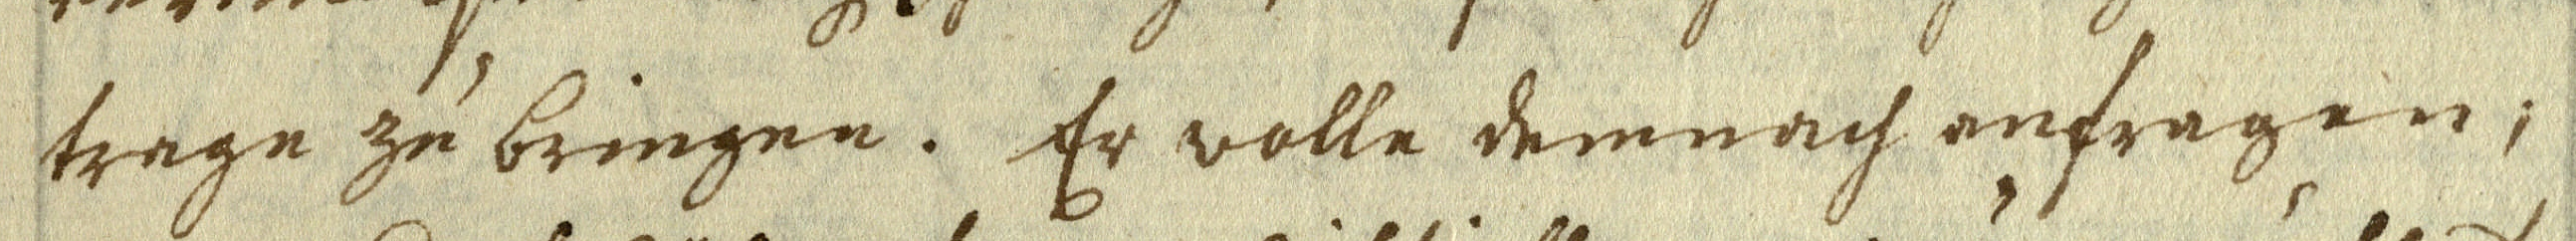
trage zu bringen. Er wolle demnach anfragen,
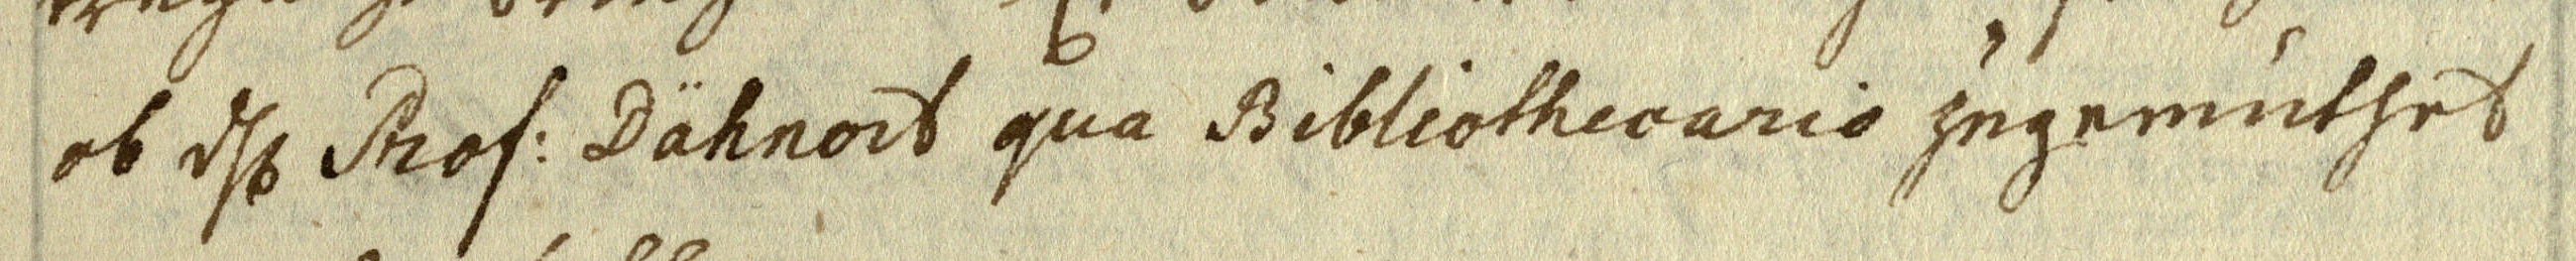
ob dh Prof: Dähnert qua Bibliothecario zugemuthet
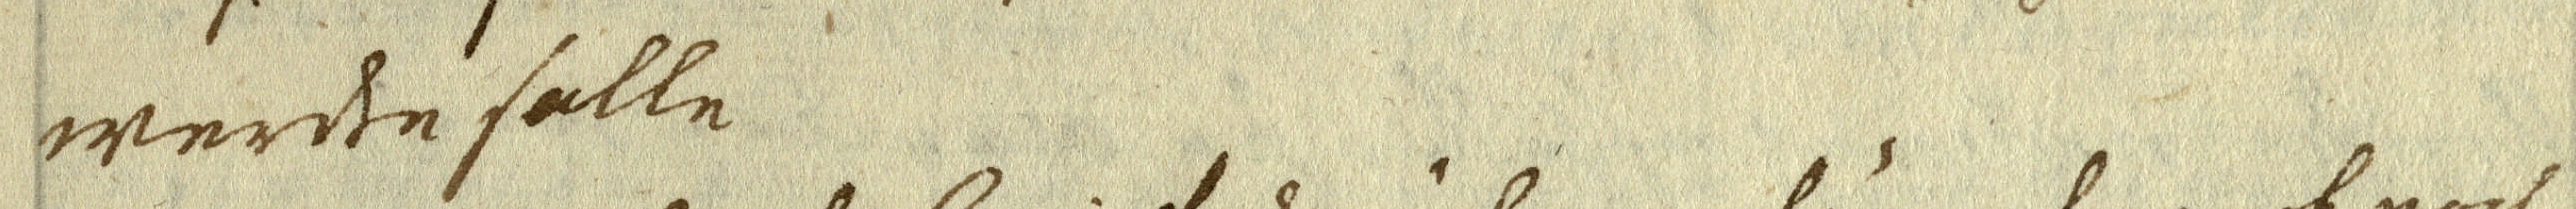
werden solle
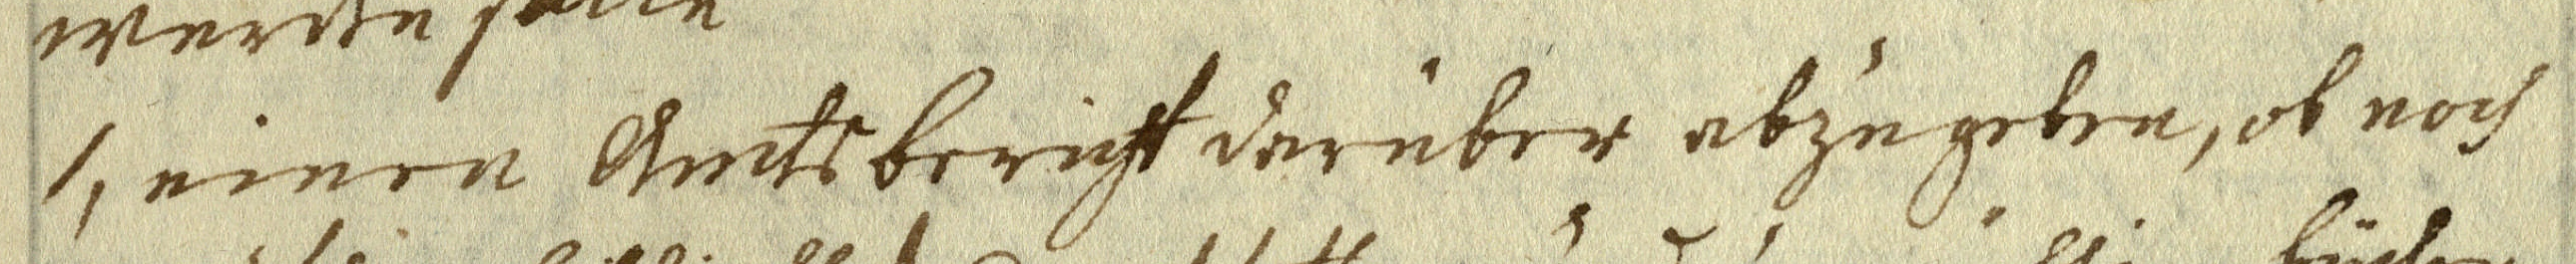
1, einen Amtsbericht darüber abzugeben, ob noch
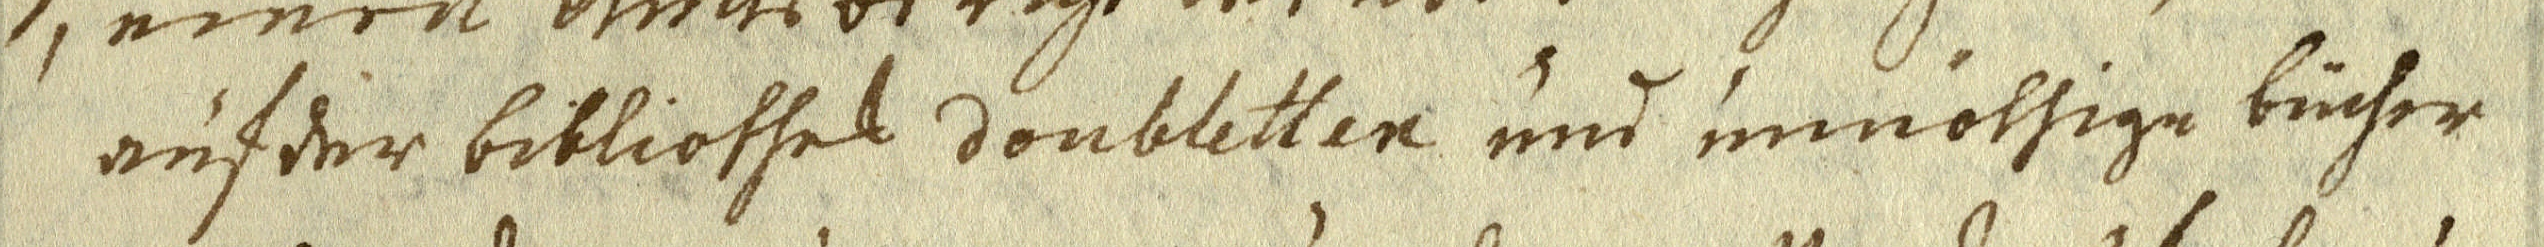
auf der Bibliothek doubletten und unnöthige Bücher
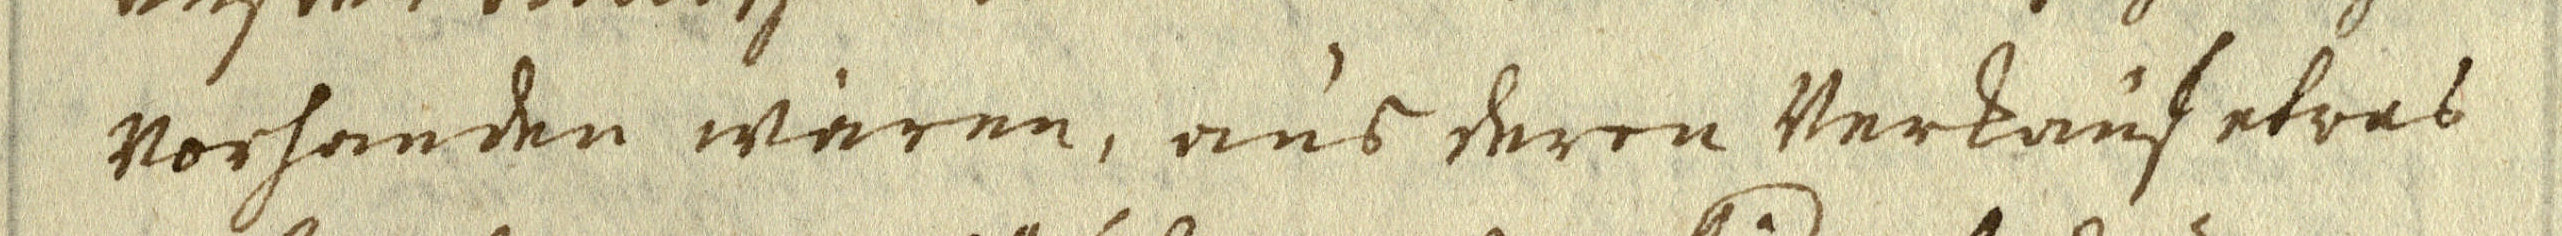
vorhanden wären, aus deren Verkauf etwas
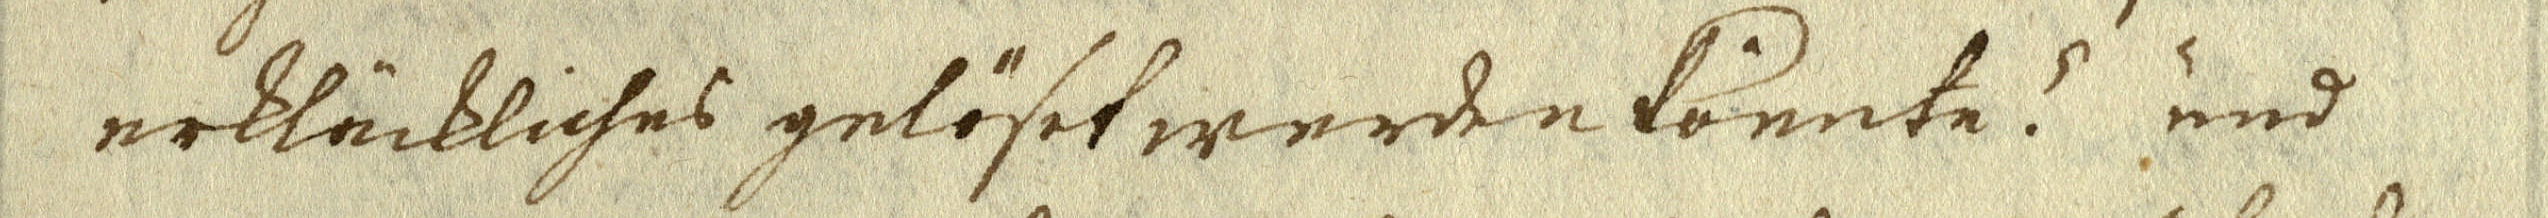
erkläckliches gelöset werden könnte? und
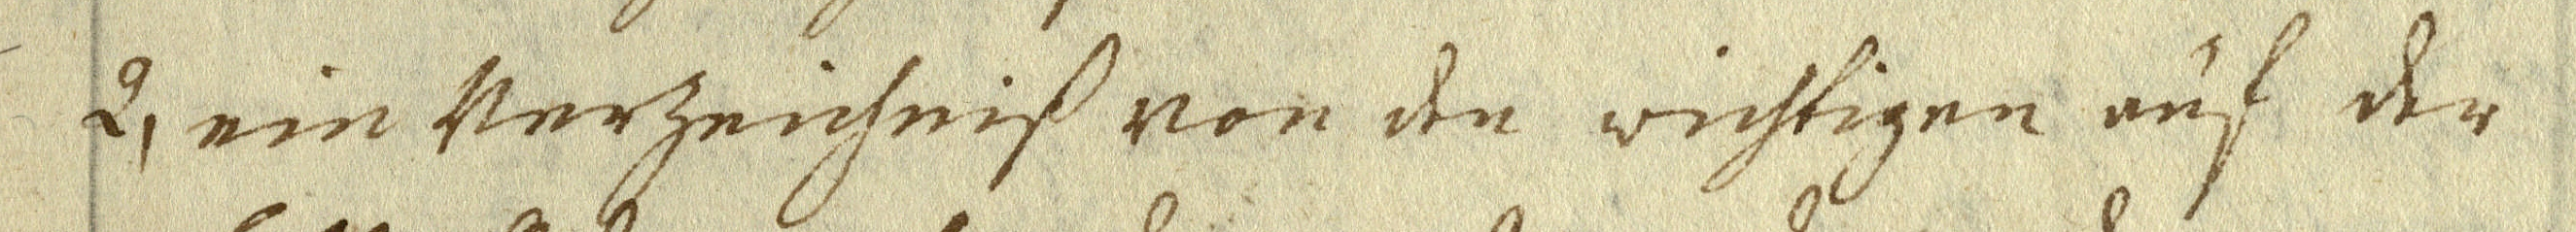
2, ein Verzeichniß von den wichtigen auf der
